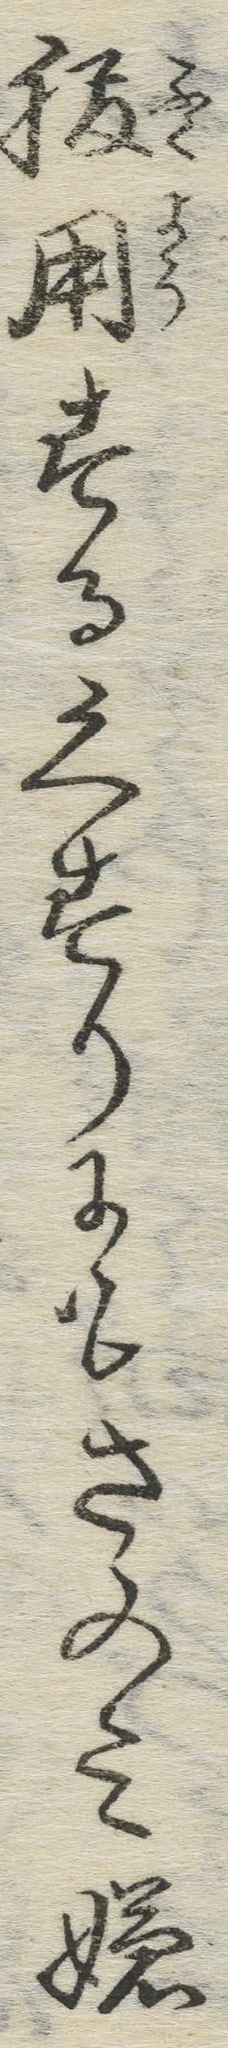腹用するくすりにもさのみ嫌
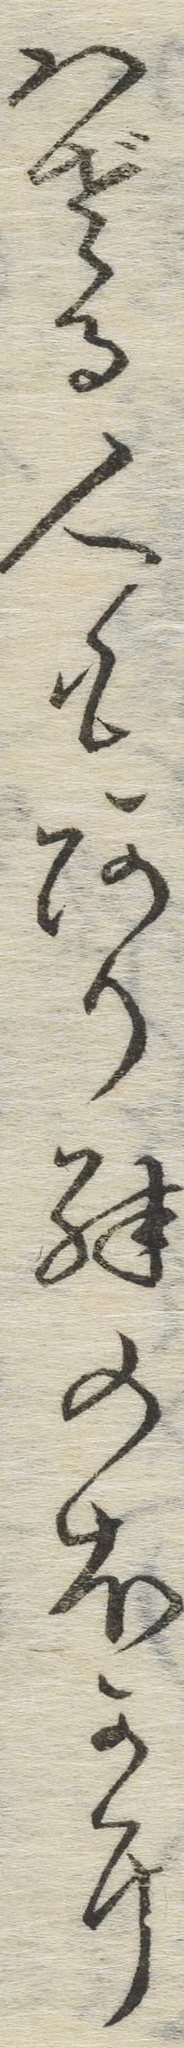はざる人もあり殊のほかに
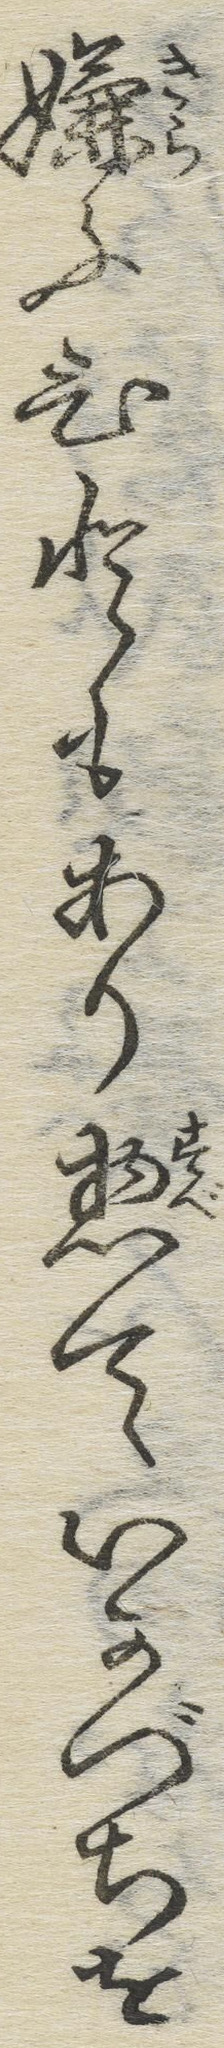嫌ふひともあり惣ていかづちを
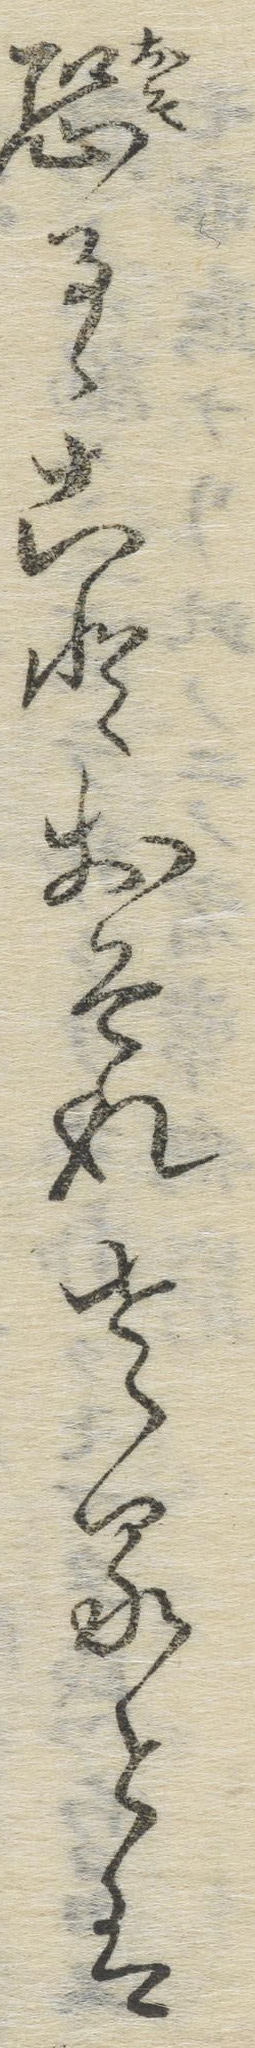恐るゝことおそれさるとは
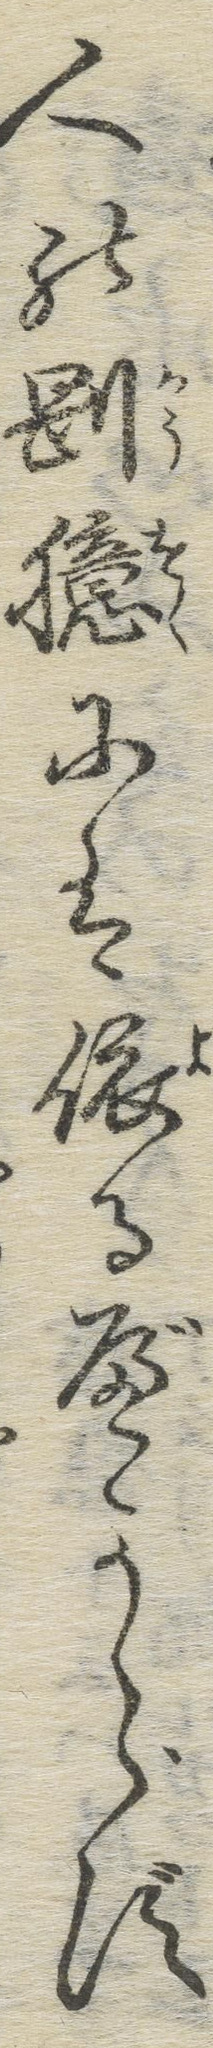人の剛臆には依るべからず
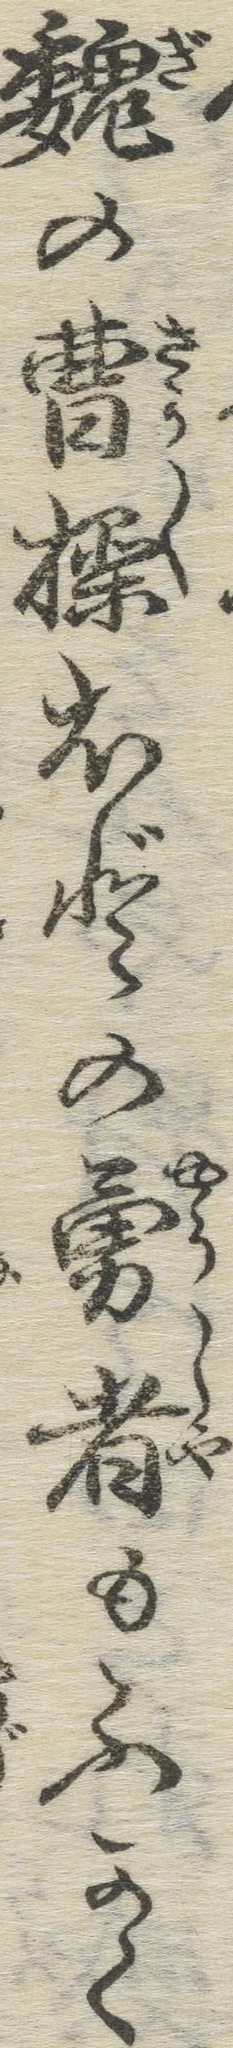魏の曹操ほどの勇者もふかく
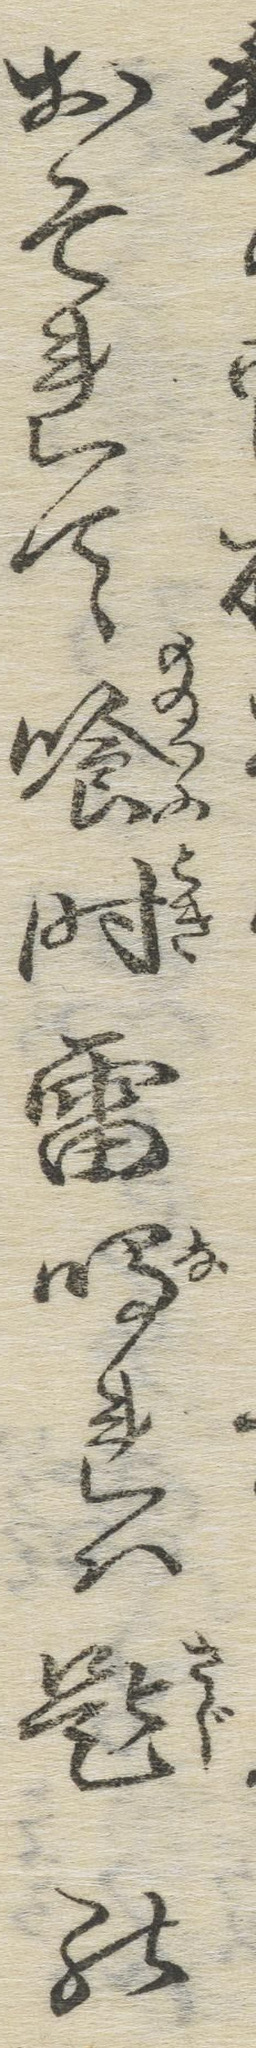おそれて喰時雷鳴れば匙の
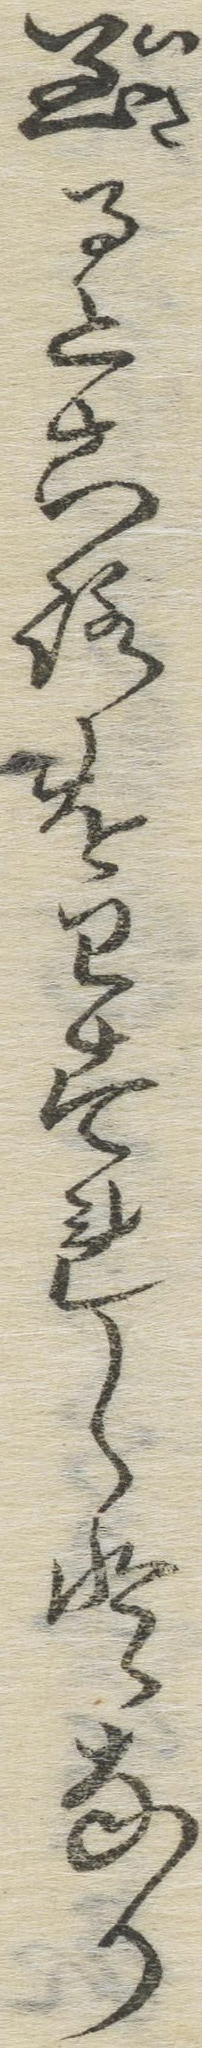至るところをわすれしとなり
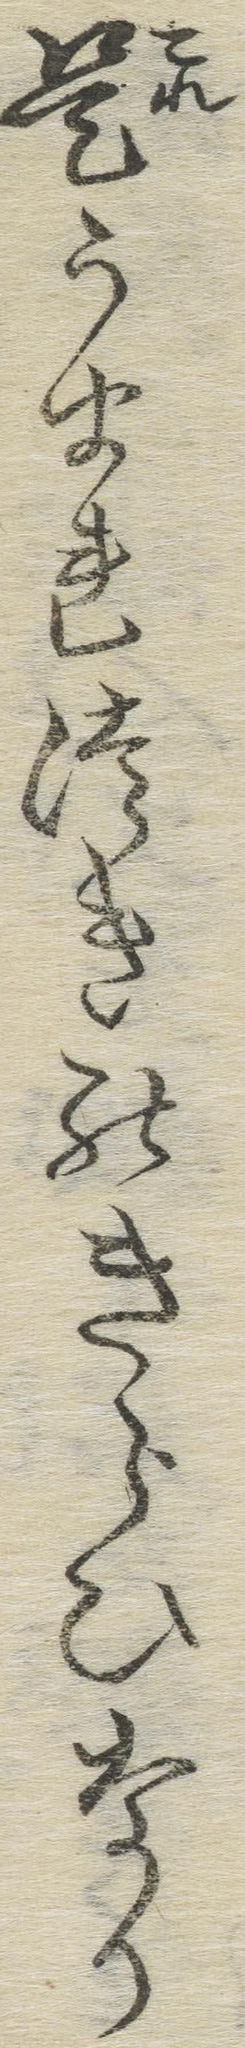是うまれつきのきらひなり
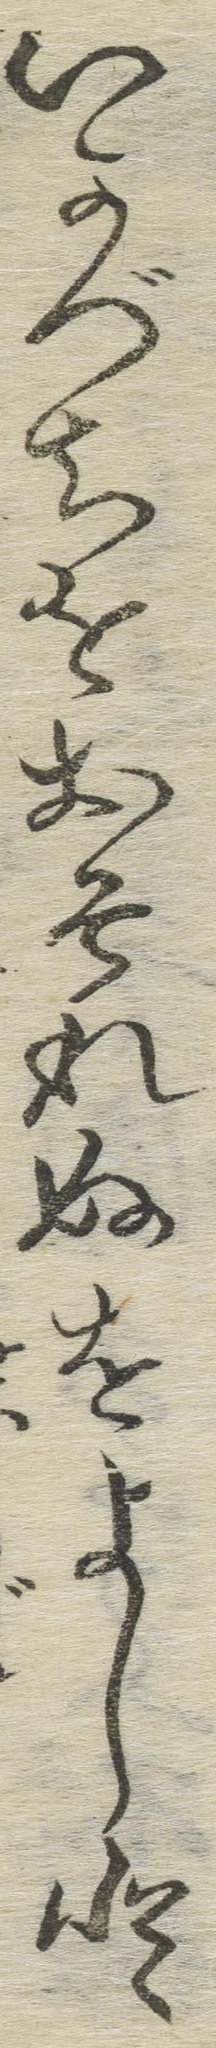いかづちをおそれぬをよしと
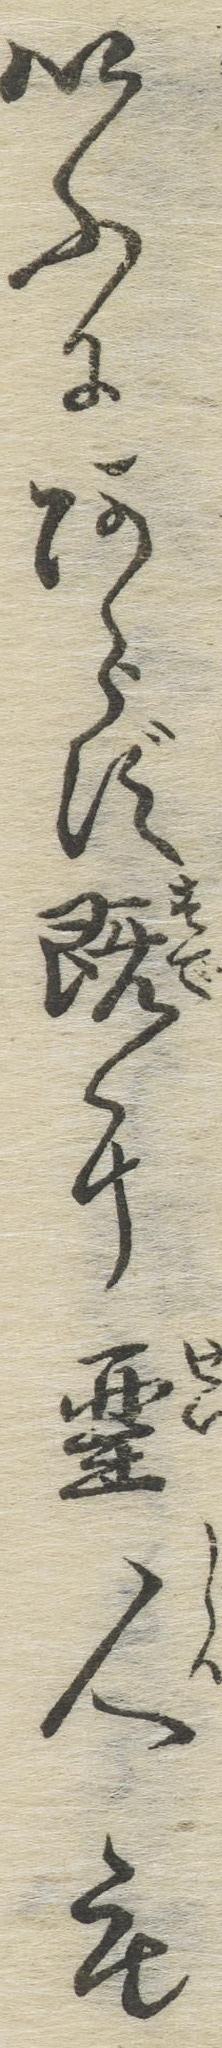いふにあらず既に聖人も

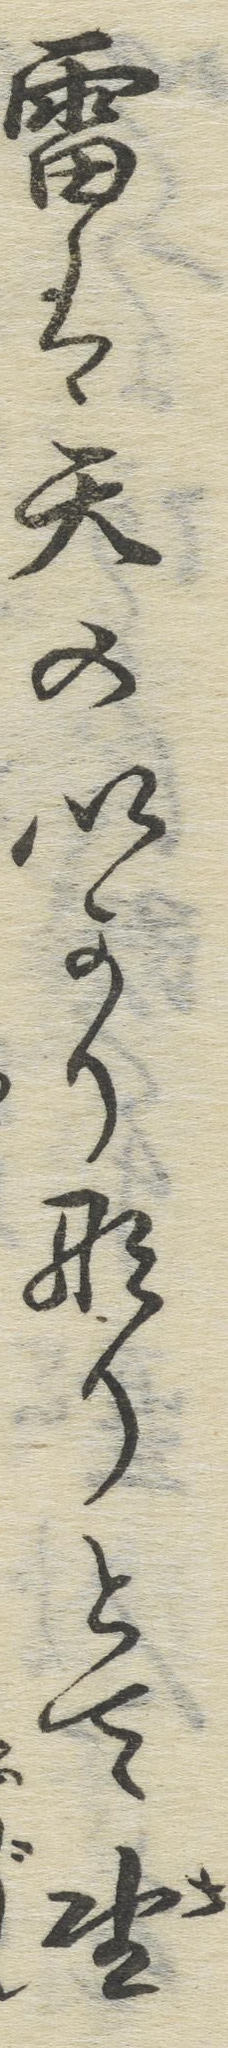雷は天のいかりなりとて坐
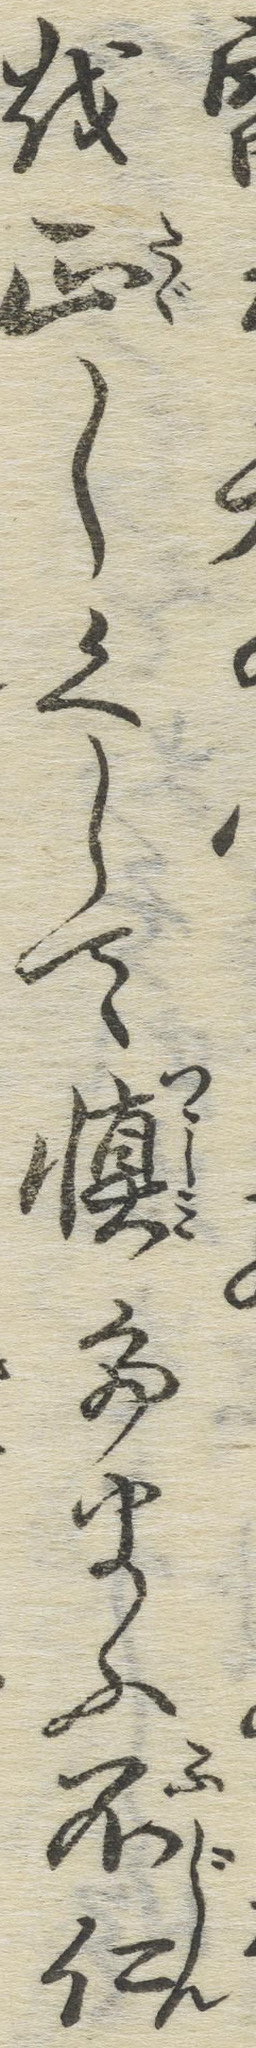を正しくして慎たまふ不仁
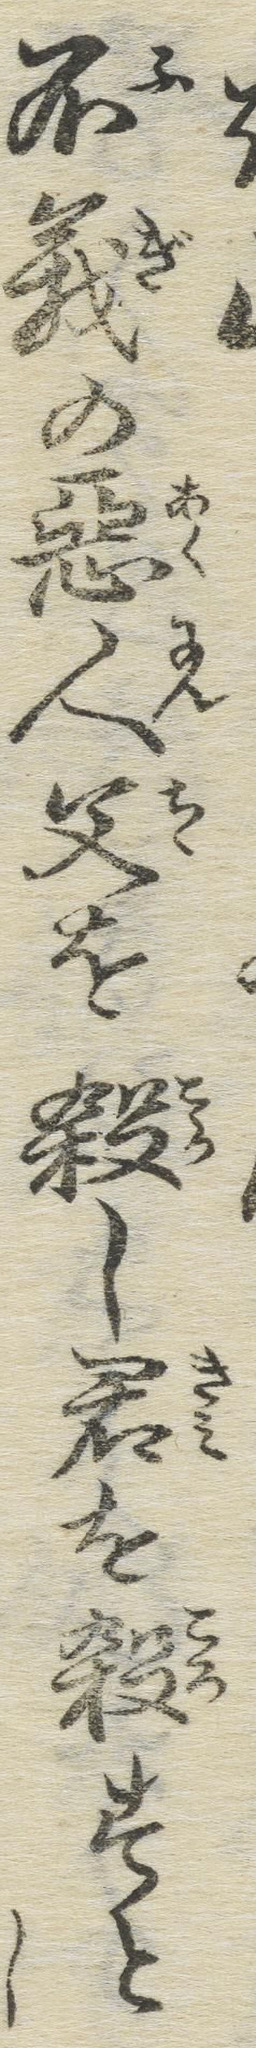不義の悪人父を殺し君を殺すと
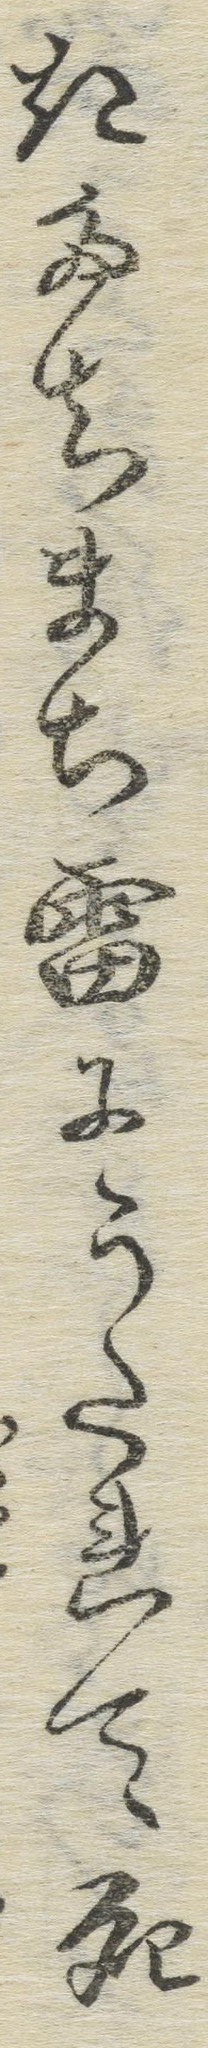きたちまち雷にうたれて死
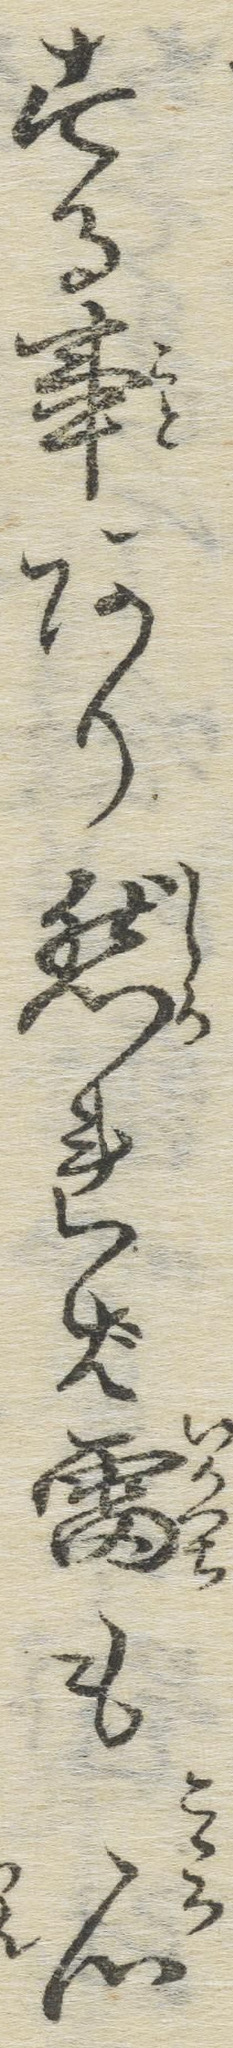する事あり然れば雷も心
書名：雷公地震由來記　全
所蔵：東京大学地震研究所図書室 Earthquake Research Institute Library, The University of Tokyo, JAPAN
